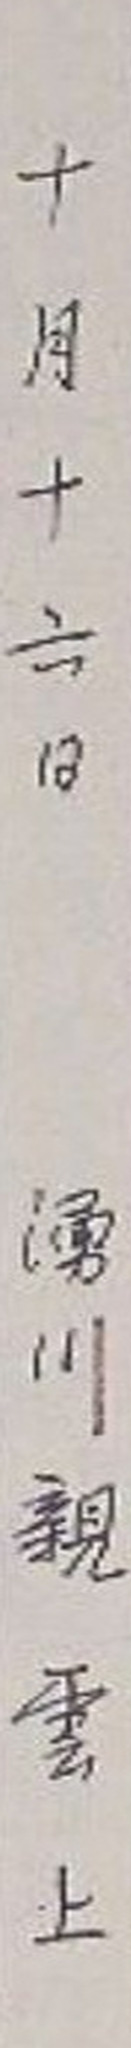十月十六日湧川親雲上
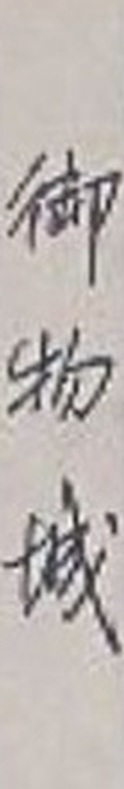御物城
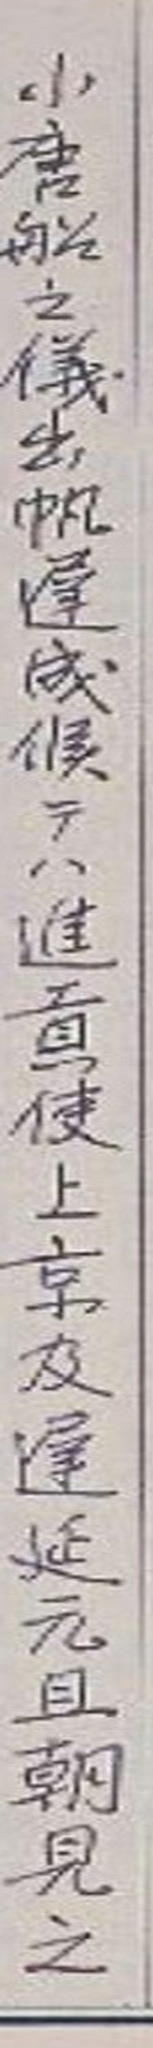小唐船之儀出帆遅成候ては進貢使上京及遅延元旦朝見之
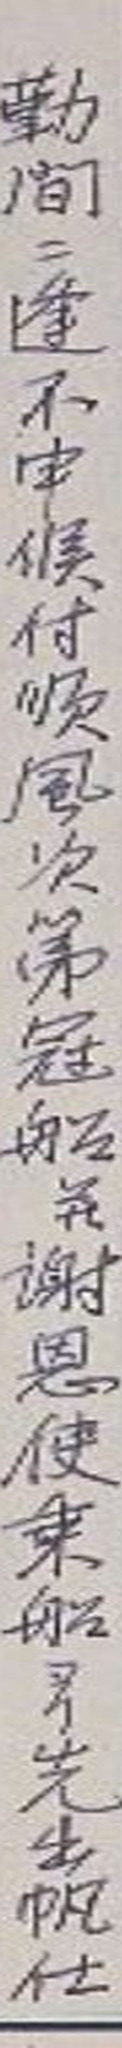勤間に逢不申候付順風次第冠船并謝恩使乗船より先出帆仕
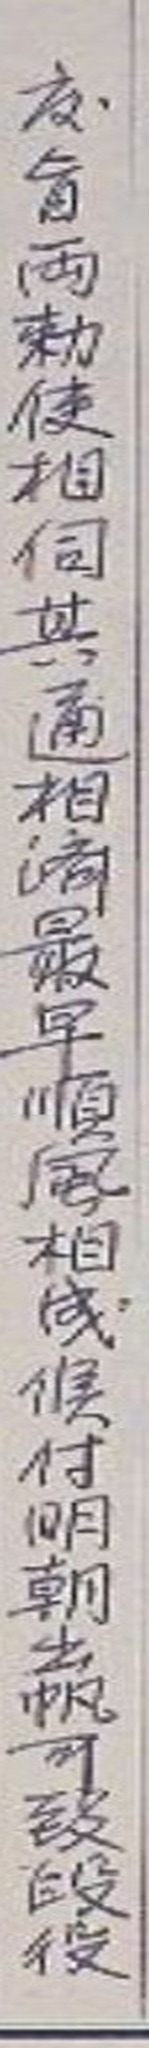度旨両勅使相伺其通相済最早順風相成候付明朝出帆可致段役
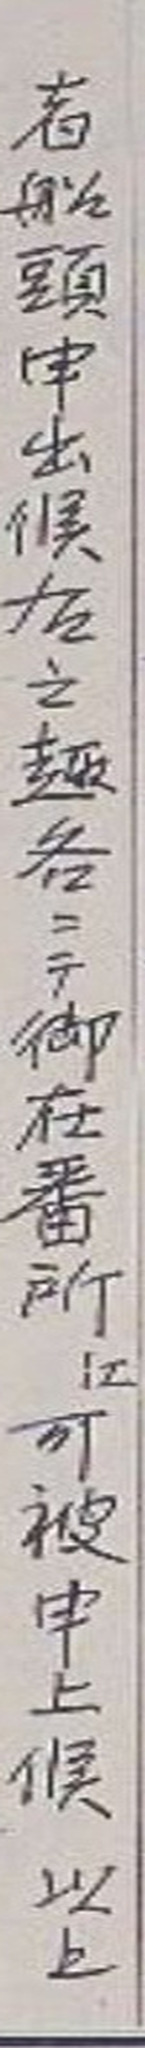者船頭申出候右之趣各にて御在番所え可被申上候以上
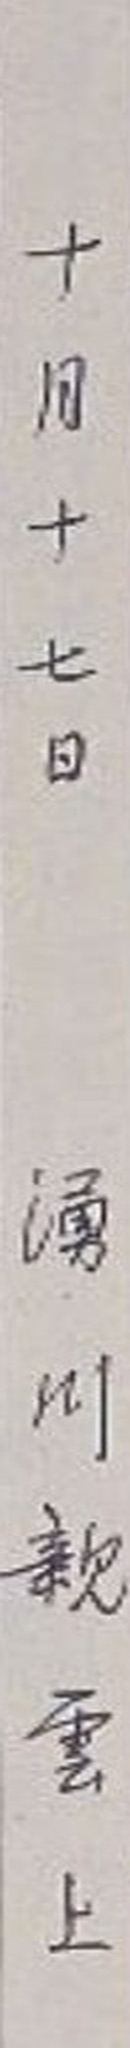十月十七日湧川親雲上
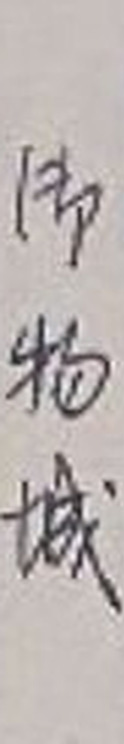御物城
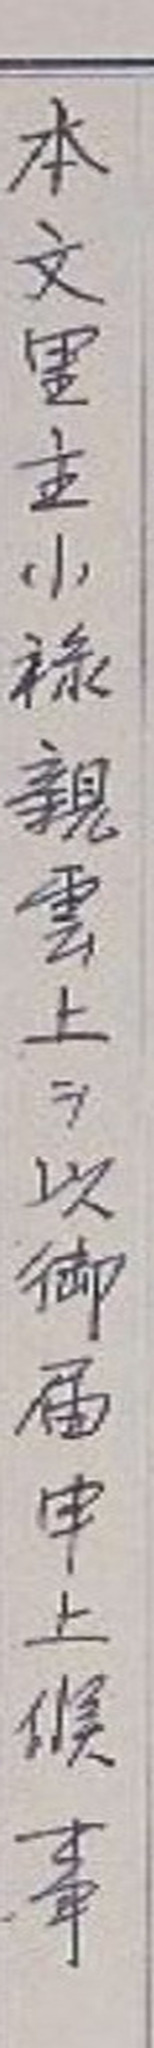本文里主小禄親雲上を以御届申上候事

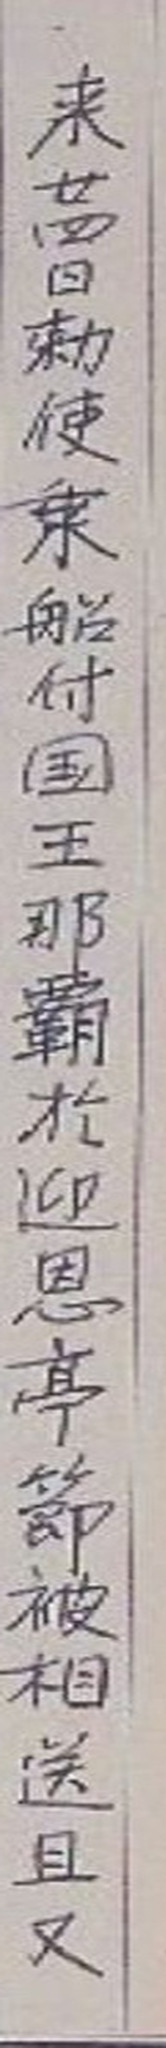来廿四日勅使乗船付国王那覇於迎恩亭節被相送且又
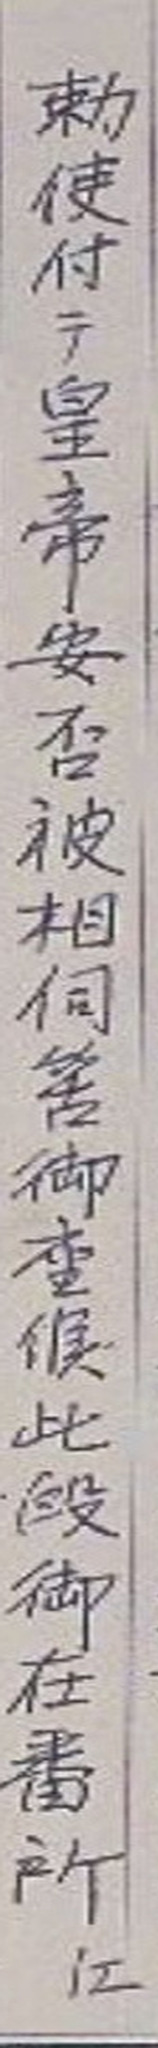勅使付て皇帝安否被相伺筈御座候此段御在番所え
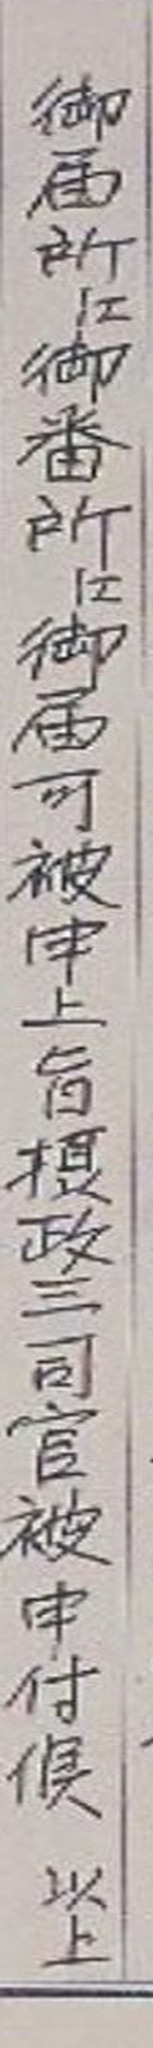御届所え御番所え御届可被申上旨摂政三司官被申付候以上
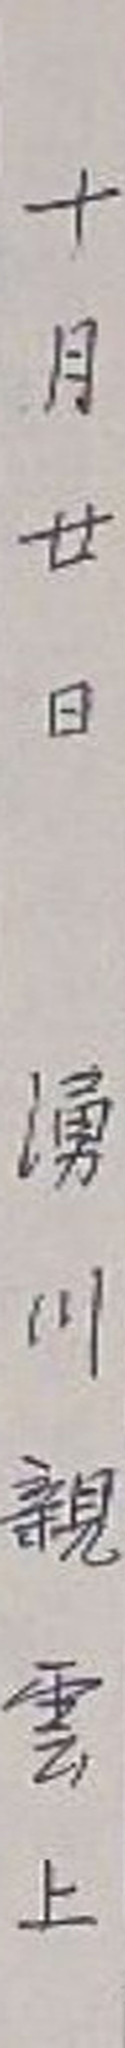十月廿日湧川親雲上
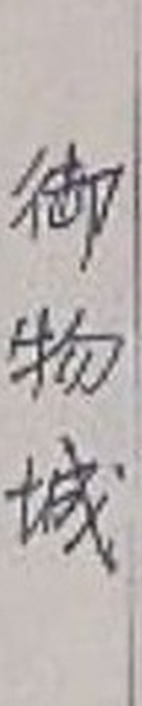御物城
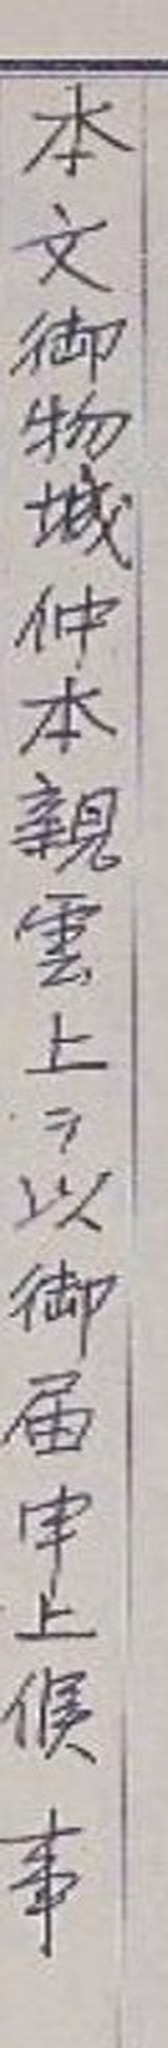本文御物城仲本親雲上を以御届申上候事
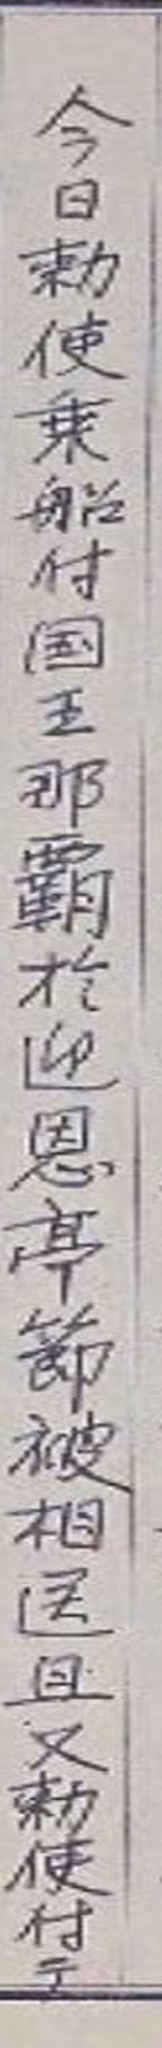今日勅使乗船付国王那覇於迎恩亭節被相送且又勅使付て
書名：支那冊封使来琉諸記 下巻
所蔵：University of the Ryukyus Library
